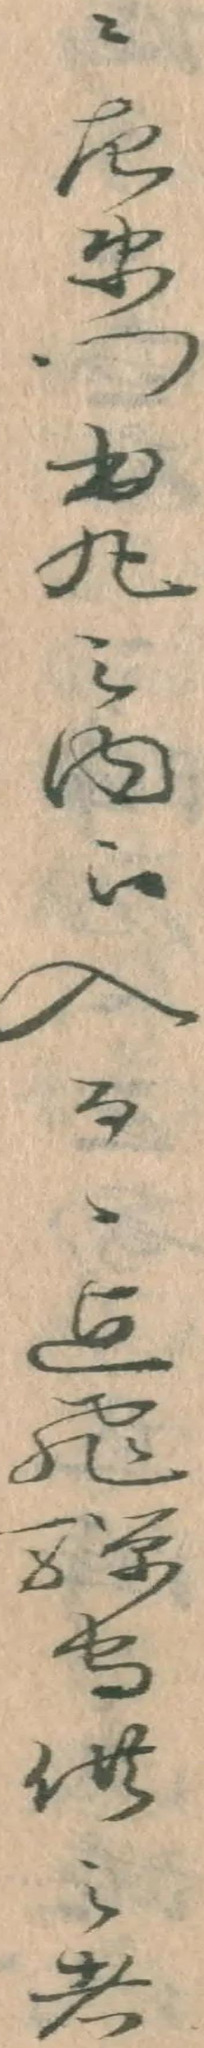に左衛門出丸之内江入るゝ迄飛騨守供之者
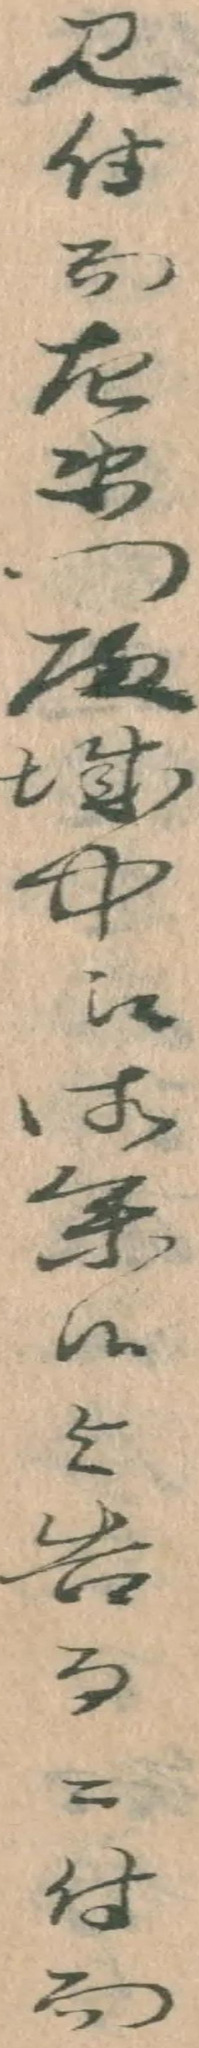見付而左衛門殿城中江御参候与告るに付而
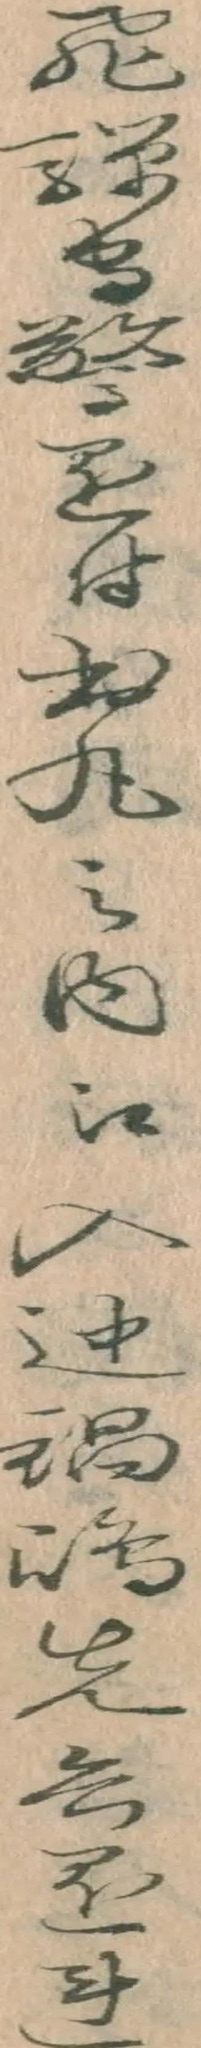飛騨守驚懸付出丸之内江入迚鍋島先兵懸連
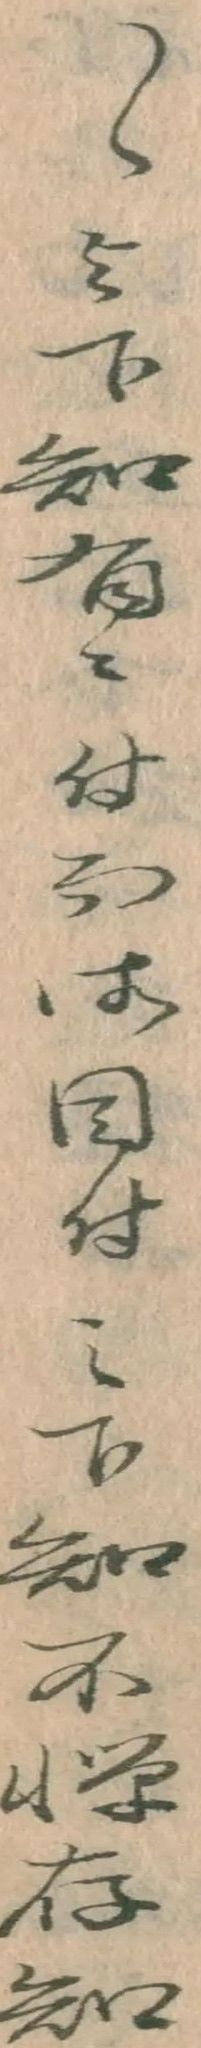〳〵与下知有に付而御目付之下知不憚存知
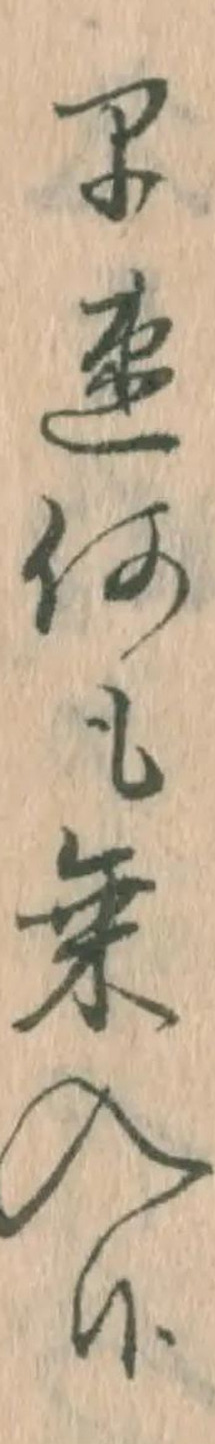早速何も乗入候
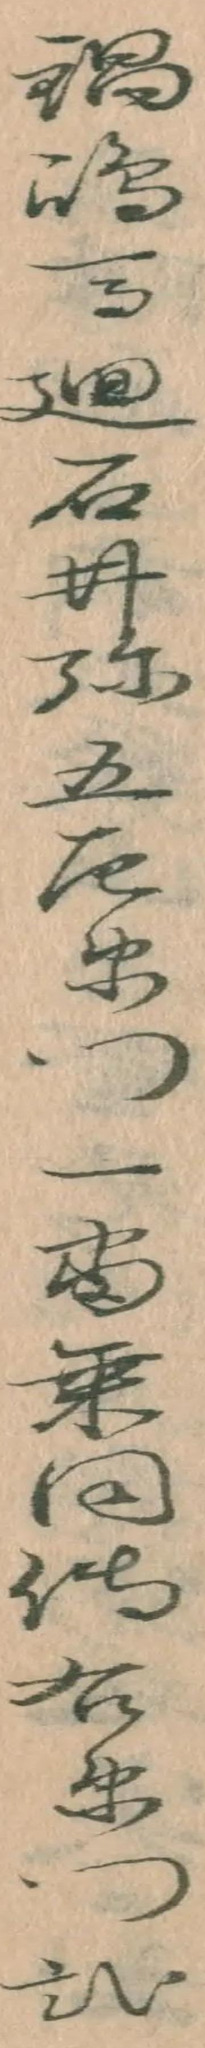鍋島馬廻石井弥五左衛門一番乗同伝右衛門弐
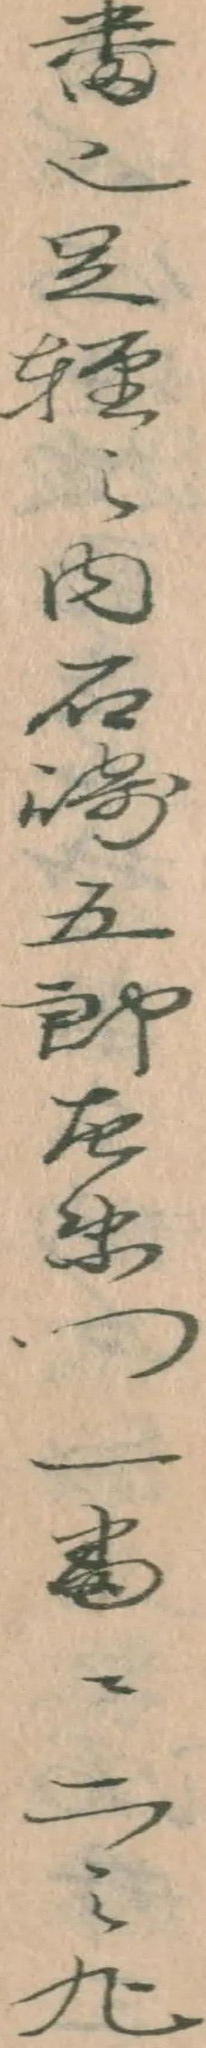番也足軽之内石崎五郎左衛門一番に二之丸
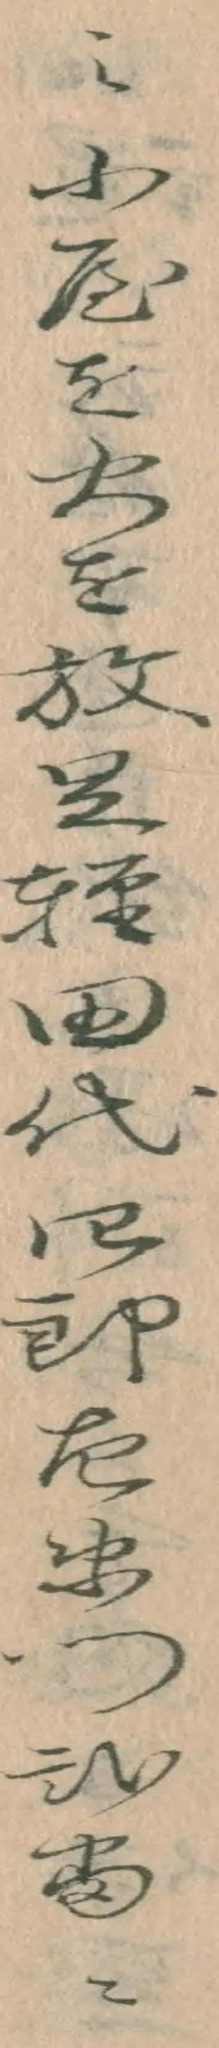之小屋を火を放足軽田代四郎左衛門弐番に
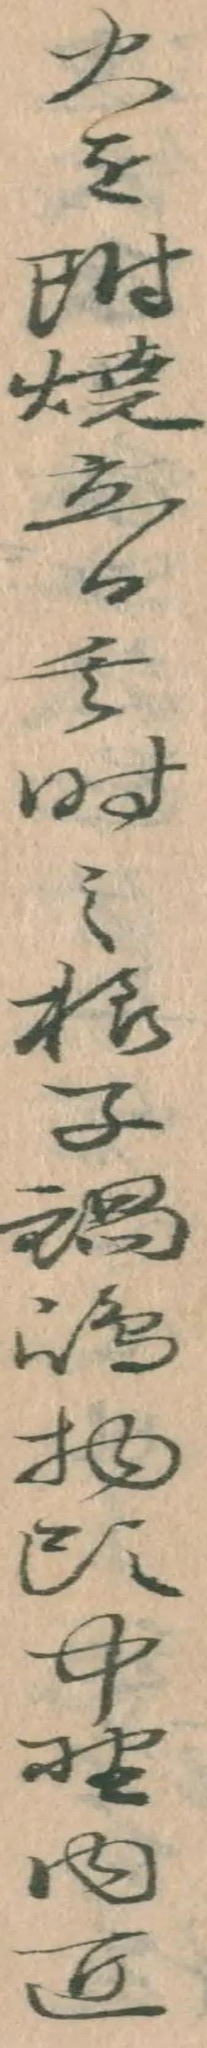火を附焼立る其時之様子鍋島物頭中野内匠
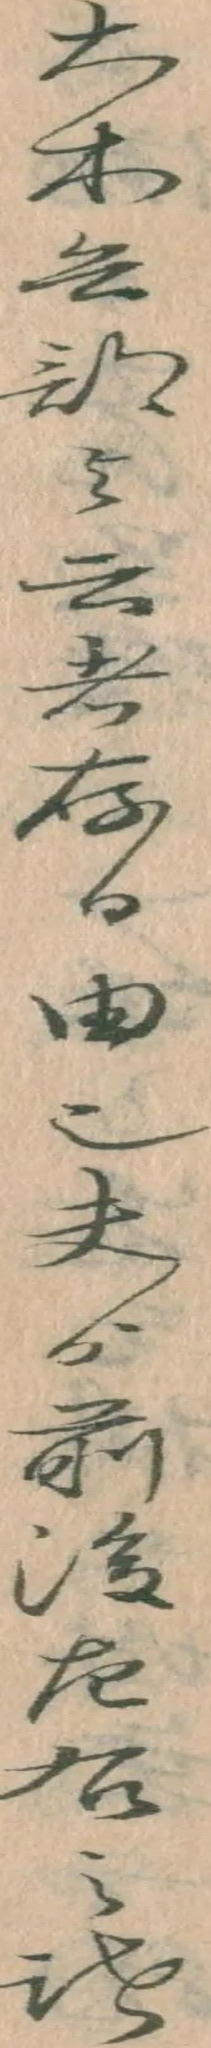大木兵部与云者存る由也夫ゟ前後左右之諸
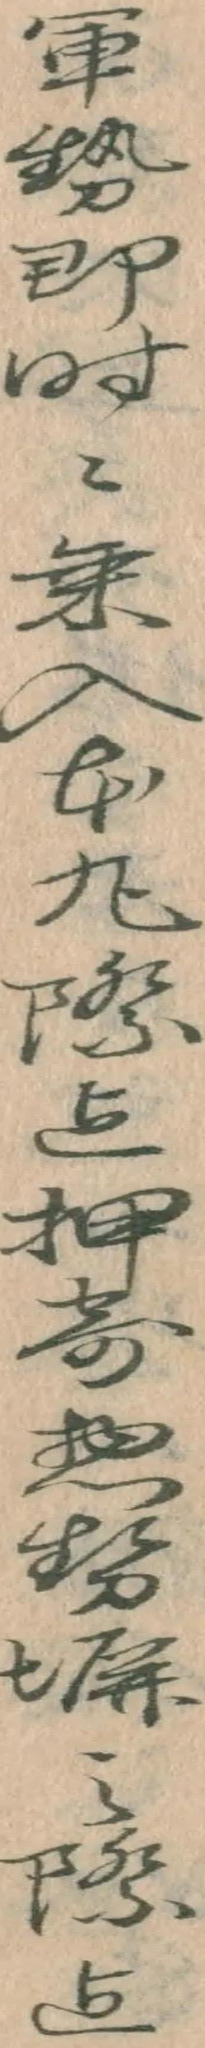軍勢即時に乗入本丸際迄押寄惣勢塀之際迄
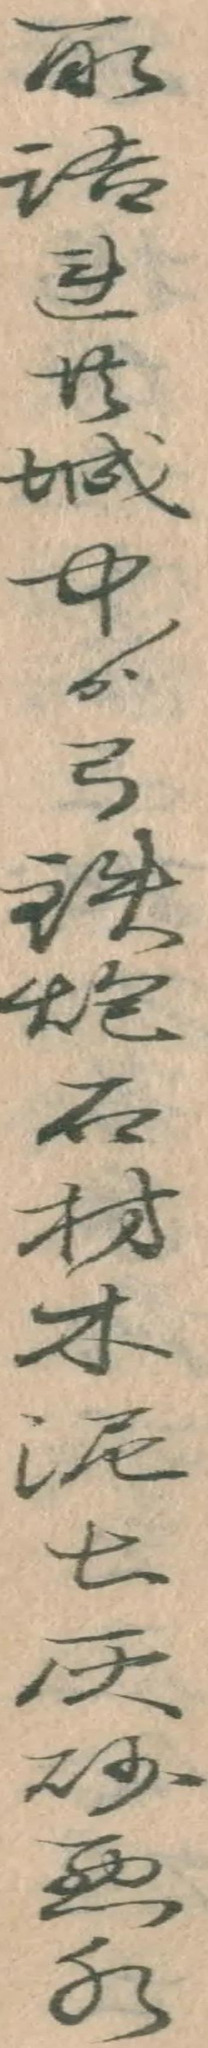取詰連共城中ゟ弓鉄炮石材木泥土灰砂悪水
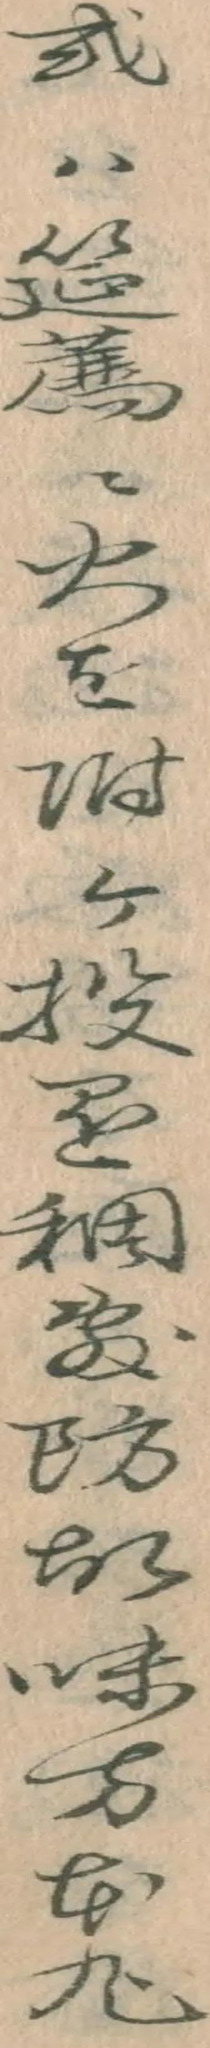或は筵藁に火を附け投懸稠敷防故味方本丸
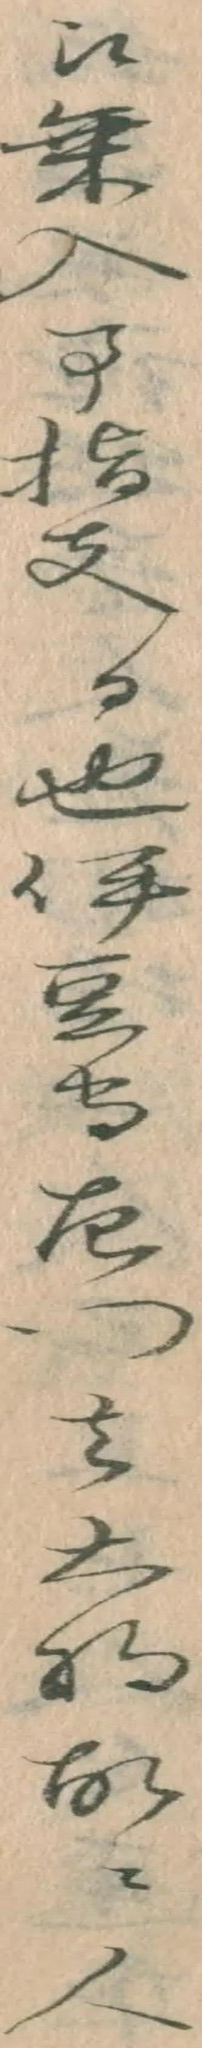江乗入事指支る也伊豆守左門者大将故に人
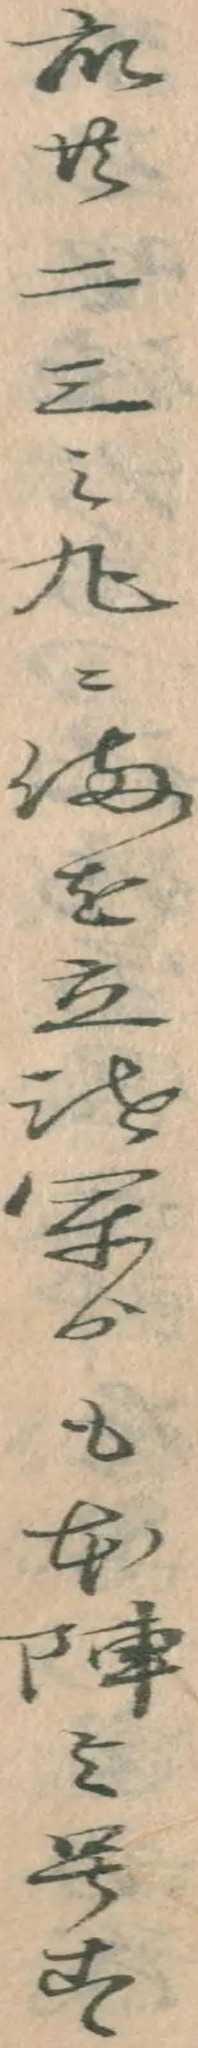衆共二三之丸に備を立諸軍ゟも本陣与号春
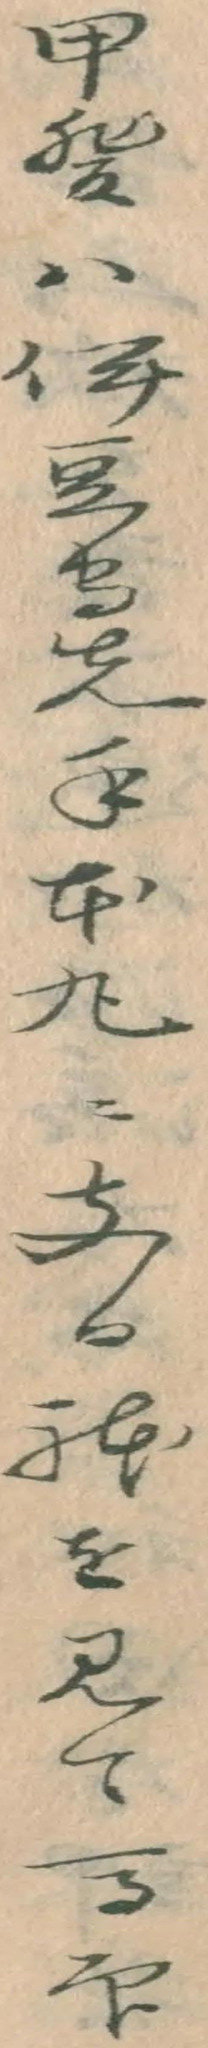甲斐は伊豆守先手本丸に支る躰を見て馬印
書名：切支丹御退治記 49巻. [8]
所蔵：国立国会図書館 National Diet Library, JAPAN
